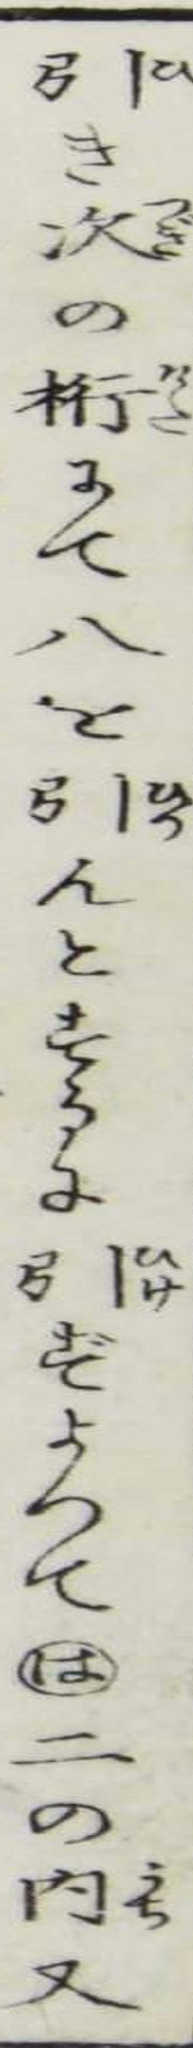引き次の桁にて八を引んとするに引ずよつて㋩二の内又
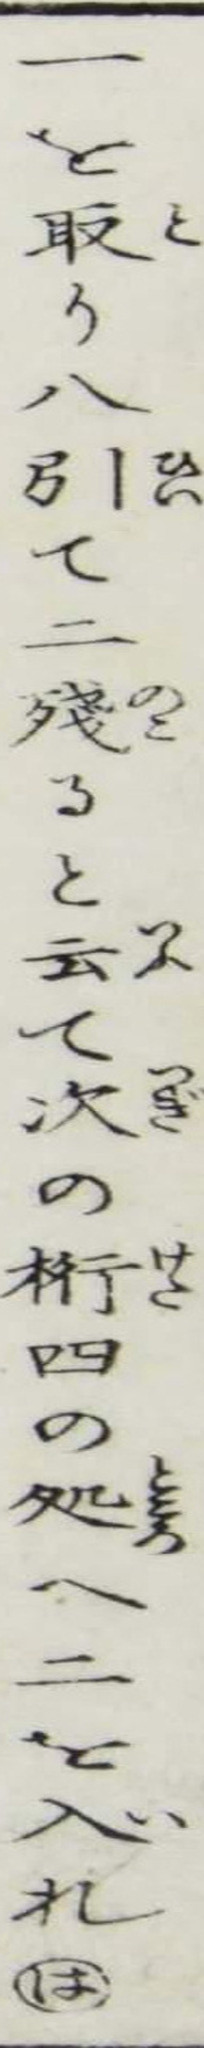一を取り八引て二残ると云て次の桁四の処へ二を入れ㋩
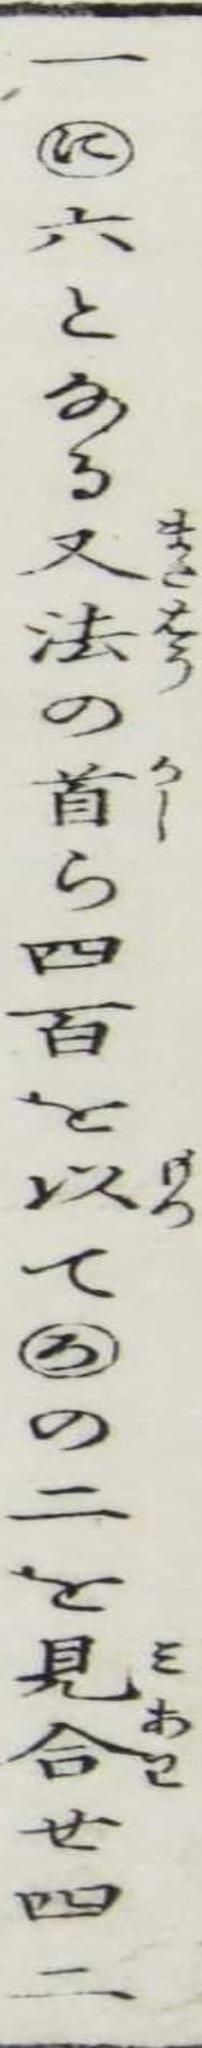一㋥六となる又法の首ら四百を以て㋺の二を見合せ四二
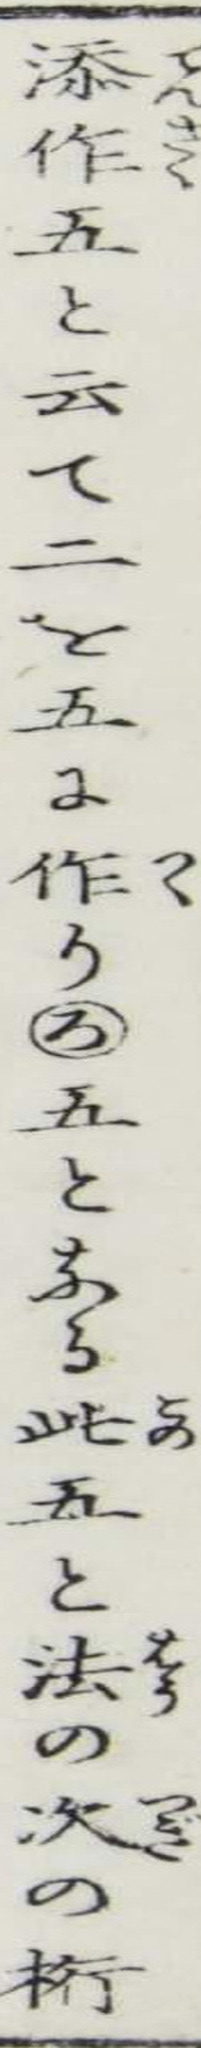添作五と云て二を五に作り㋺五となる此五と法の次の桁
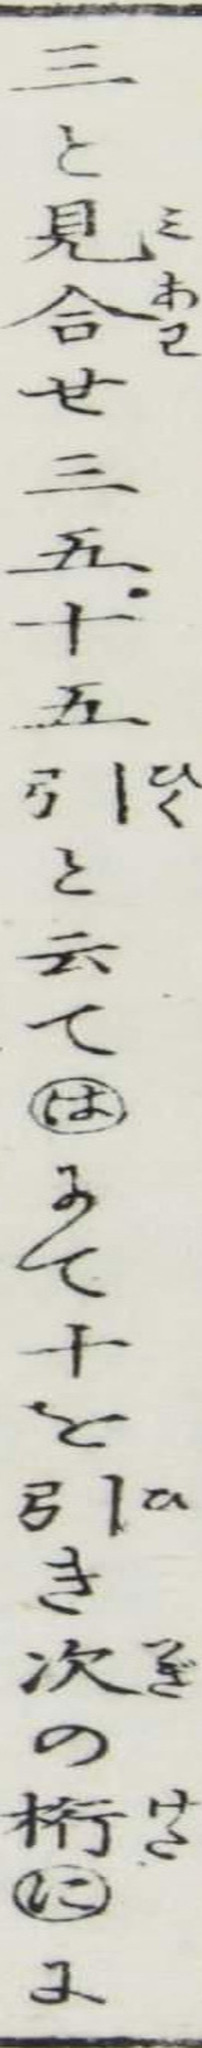三と見合せ三五．十五引と云て㋩にて十を引き次の桁㋥に
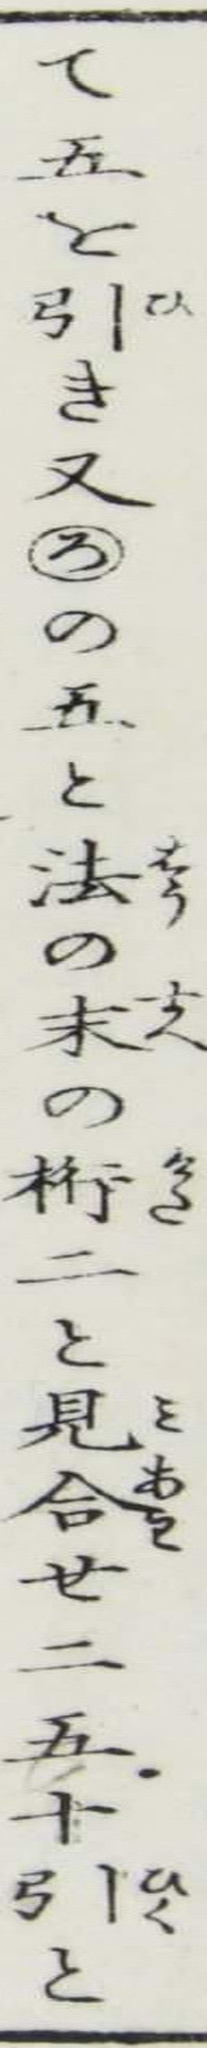て五を引き又㋺の五と法の末の桁二と見合せ二五．十引と
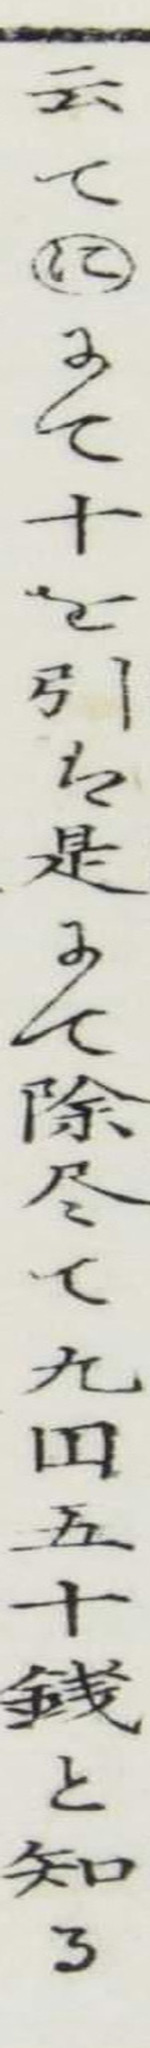云て㋥にて十を引は是にて除尽て九円五十銭と知る
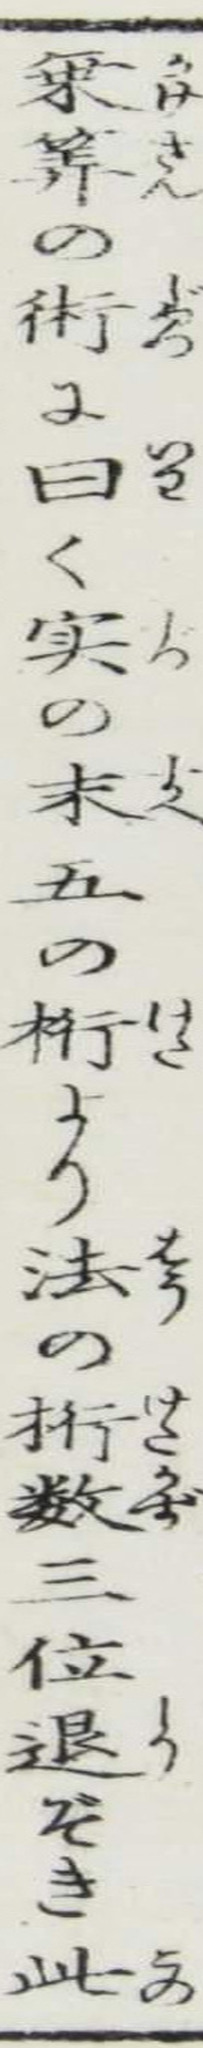乗算の術に曰く実の末五の桁より法の桁数三位退ぞき此
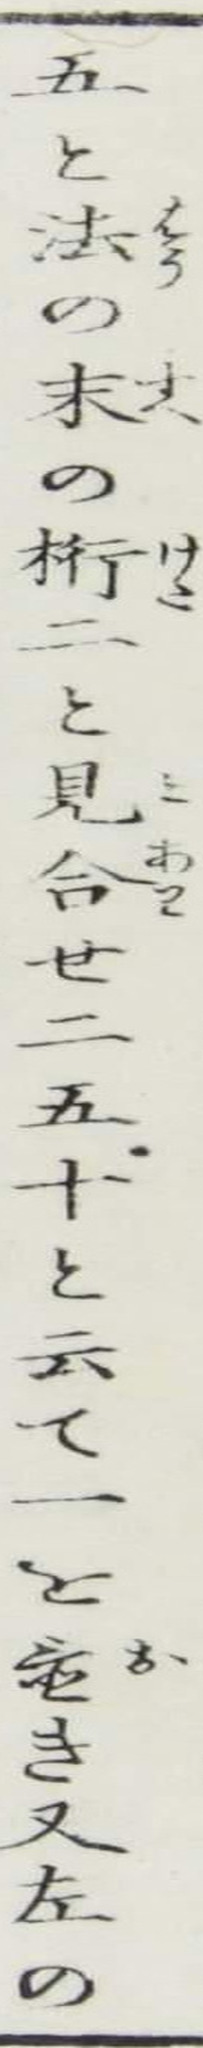五と法の末の桁二と見合せ二五．十と云て一を置き又左の
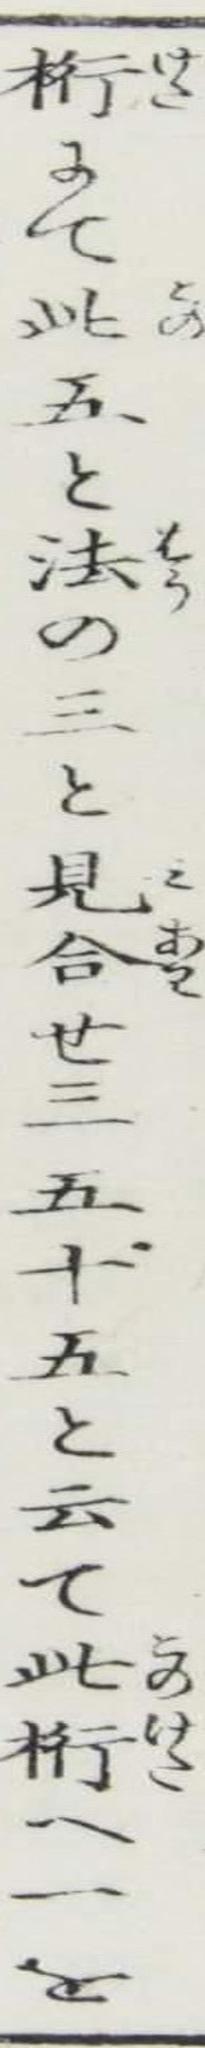桁にて此五と法の三と見合せ三五．十五と云て此桁へ一を
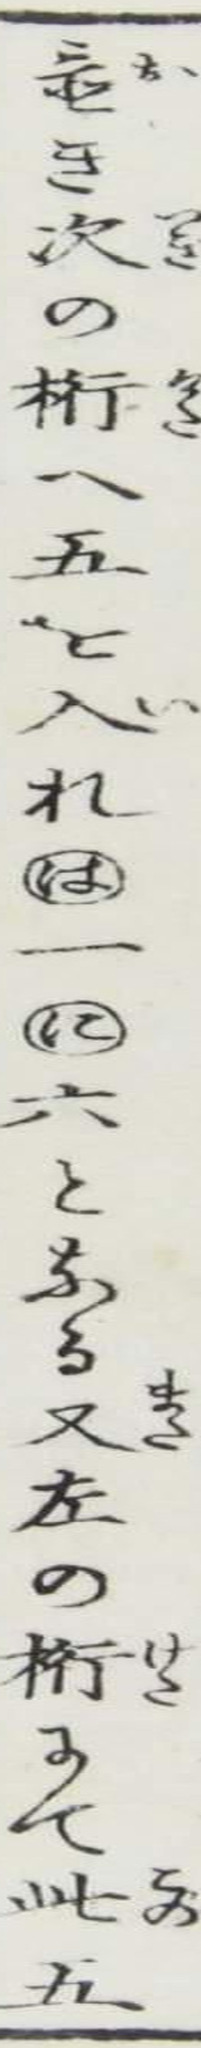置き次の桁へ五を入れ㋩一㋥六となる又左の桁にて此五
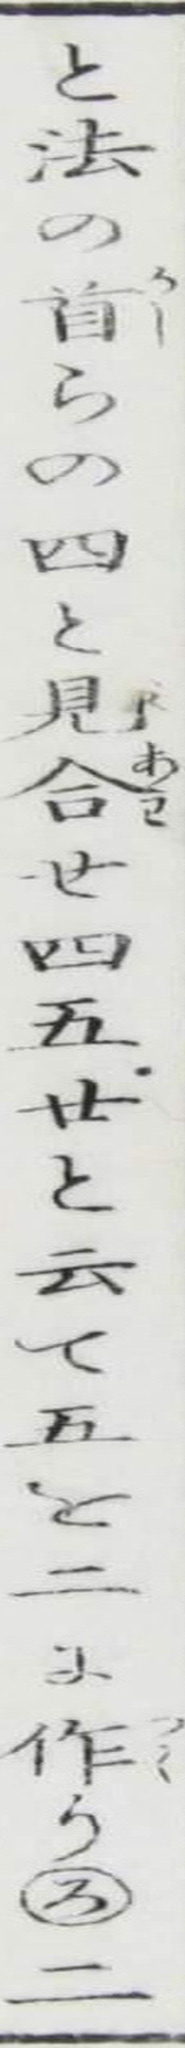と法の首らの四と見合せ四五．廿と云て五を二に作り㋺二
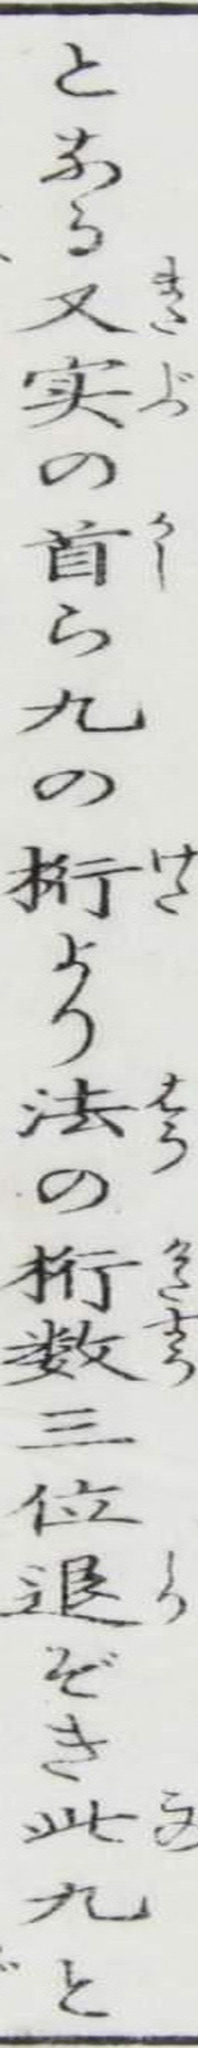となる又実の首ら九の桁より法の桁数三位退ぞき此九と
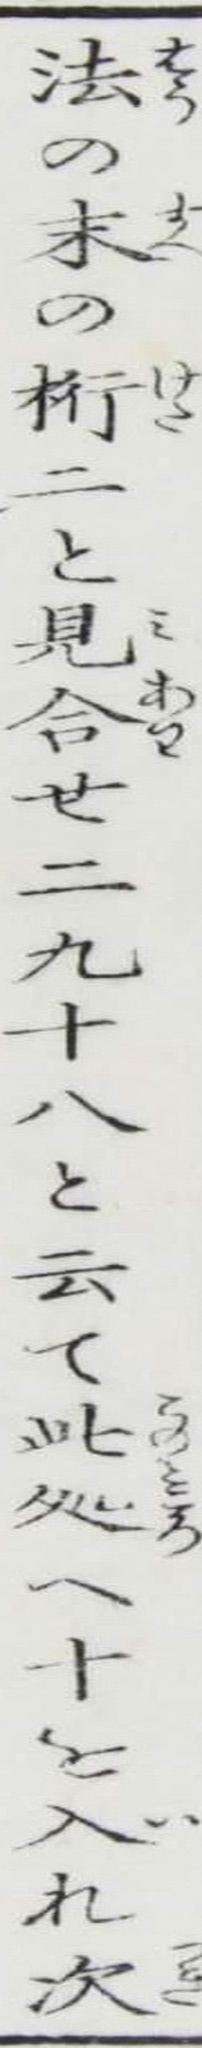法の末の桁二と見合せ二九十八と云て此処へ十を入れ次
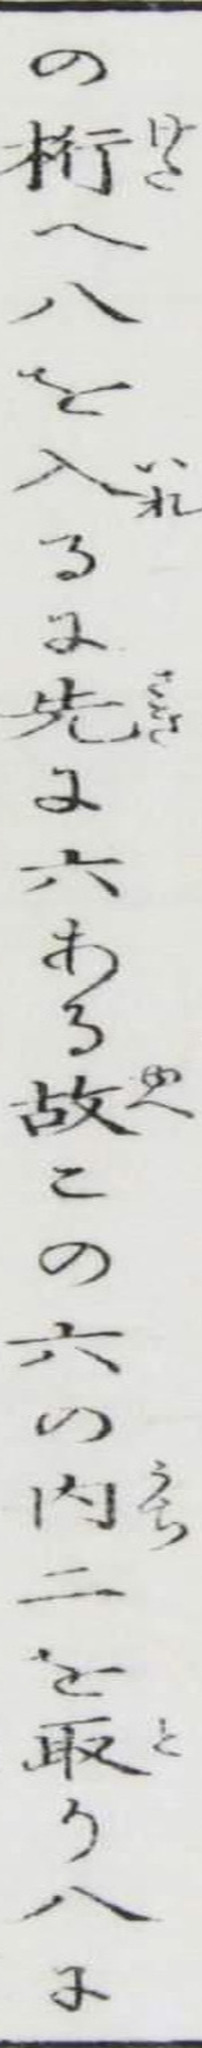の桁へ八を入るに先に六ある故この六の内二を取り八に
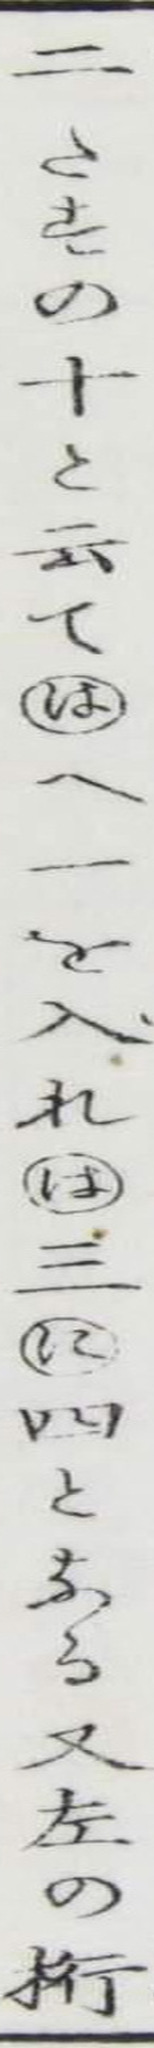二たすの十と云て㋩へ一を入れ㋩三㋥四となる又左の桁
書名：明治小學塵劫記 卷1
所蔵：東京学芸大学教育コンテンツアーカイブ
